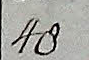48
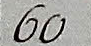60
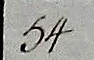54
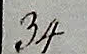34
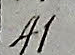41
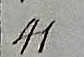41
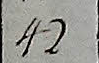42
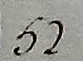52
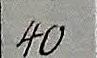40
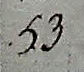53
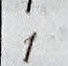1
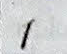1
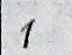1
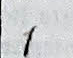1
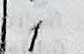1
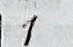1
